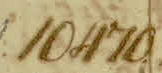10470.
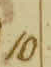10
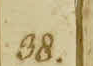38.
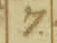7.
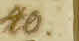40.
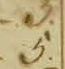5.
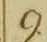9.
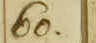60.
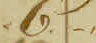6.
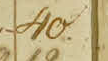40.
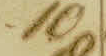10
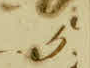5.
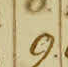9.
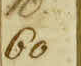60
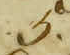5.
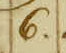6.
